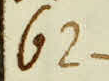62
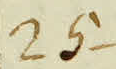25
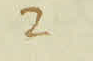2
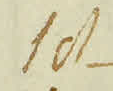18
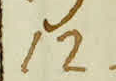12
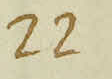22
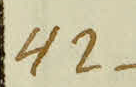42
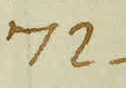72
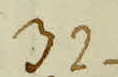32
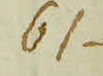61
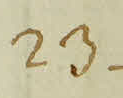23
